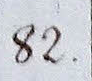82
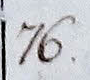76
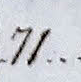71.
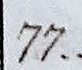77
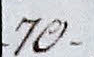70
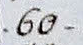60
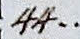44
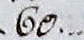60
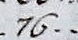76
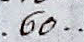60
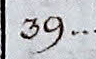39
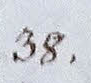38
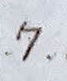7
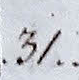31
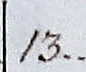13
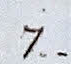7
